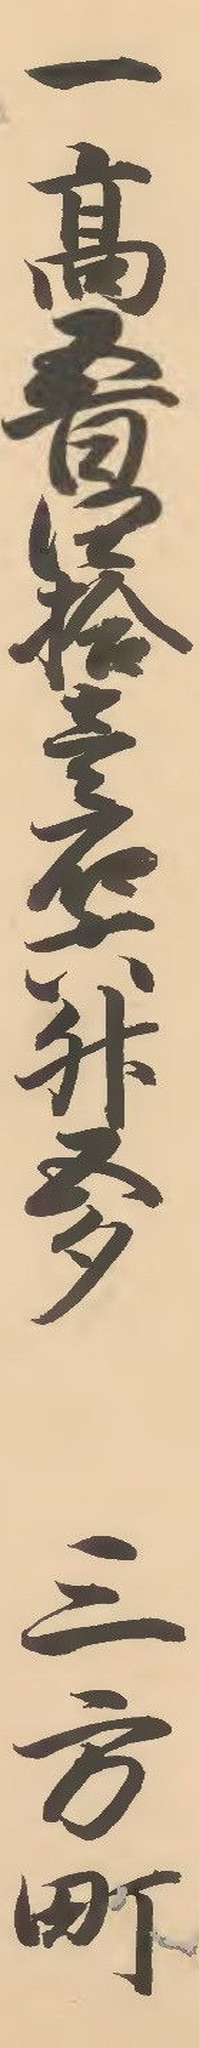一髙五百四拾壱石六升五夕三方町
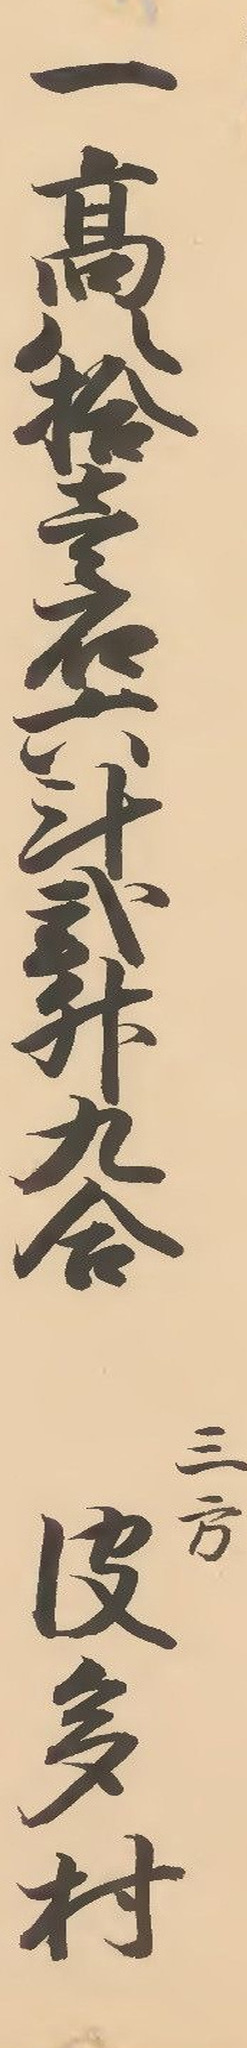一髙八拾壱石六斗弐升九合皮多村
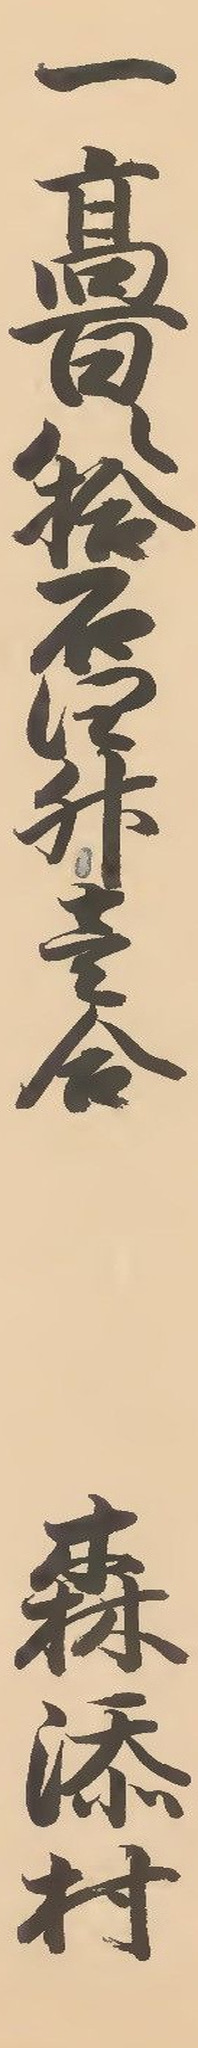一髙百八拾石四升壱合森添村
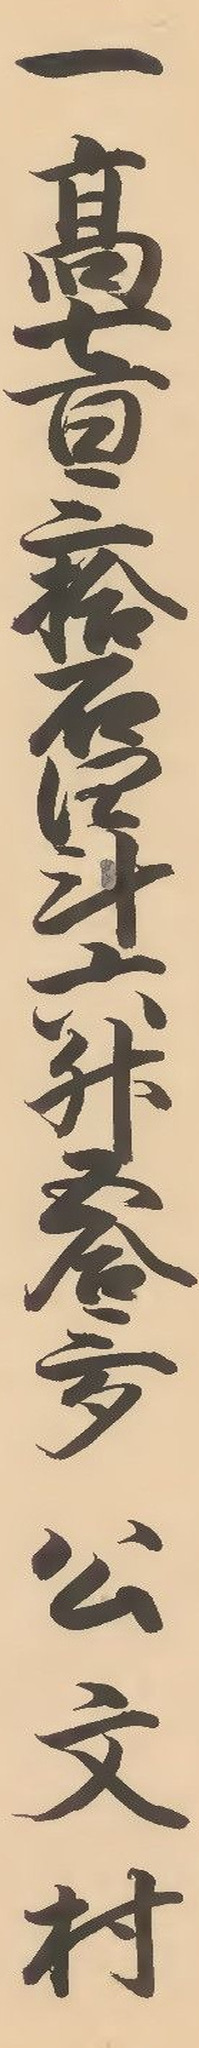一髙七百三拾石四斗六升五合三夕公文村
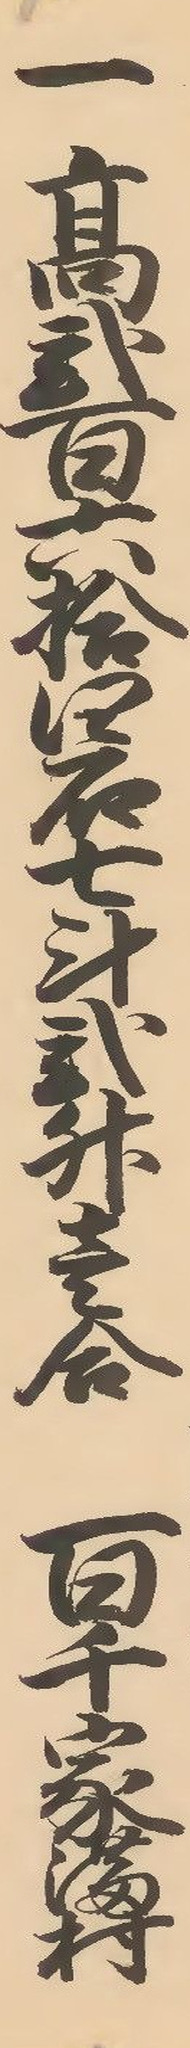一髙弐百六拾四石七斗弐升壱合百千家滿村
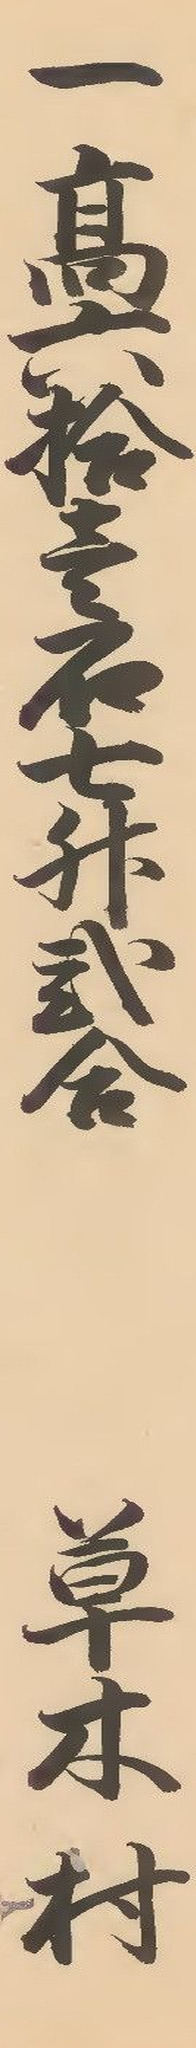一髙六拾壱石七升弐合草木村
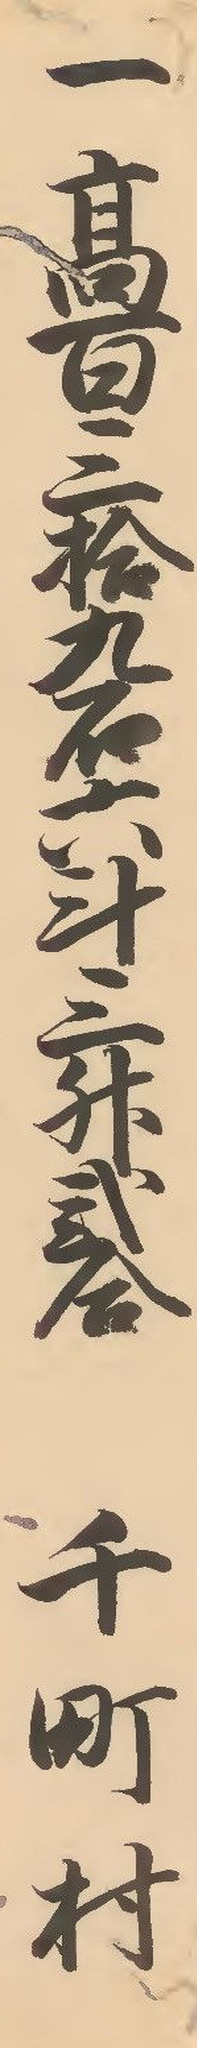一髙百三拾九石六斗三升弐合千町村

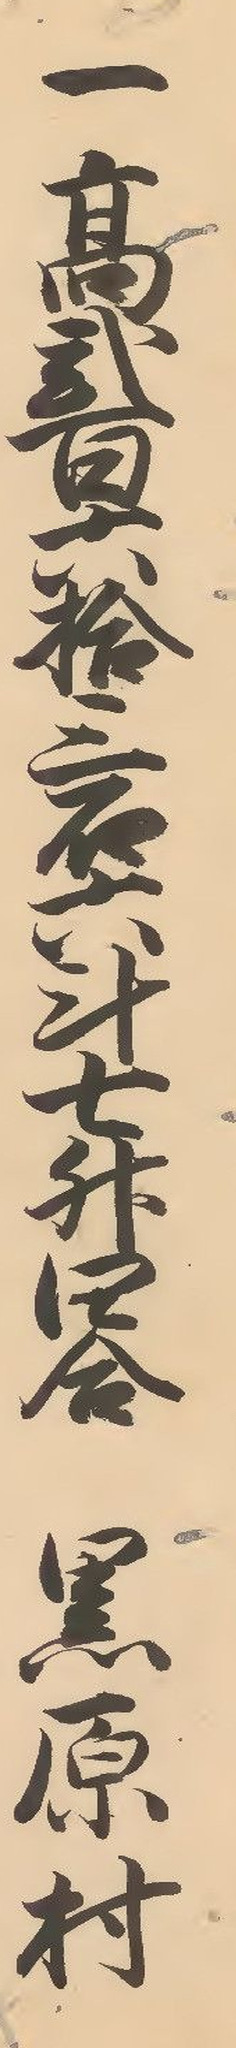一髙弐百六拾三石六斗七升四合黑原村
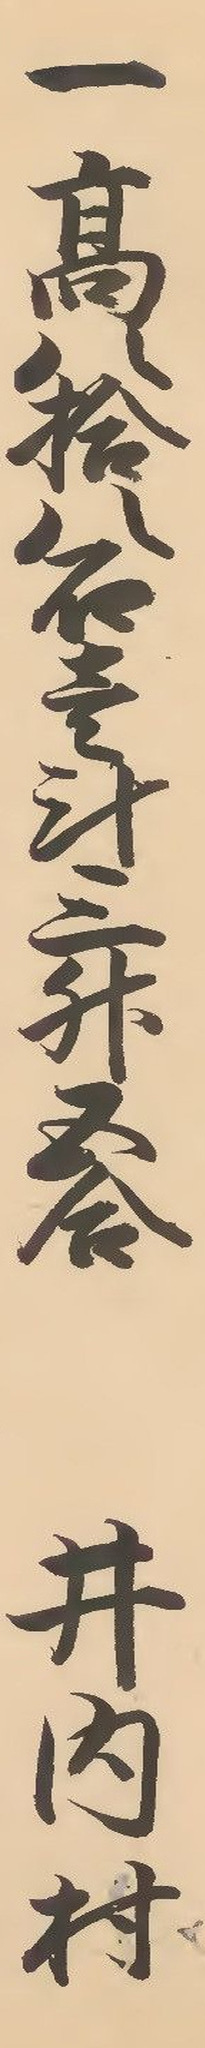一髙八拾八石壱斗三升五合井内村
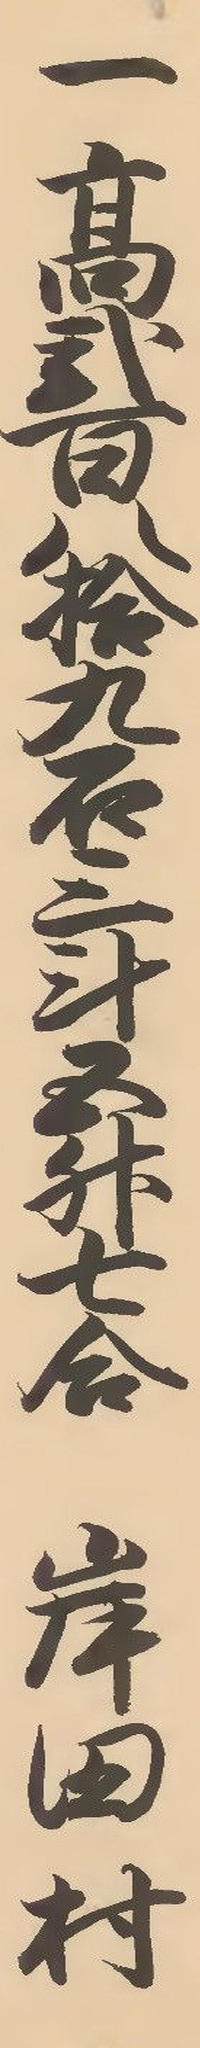一髙弐百八拾九石三斗五升七合岸田村
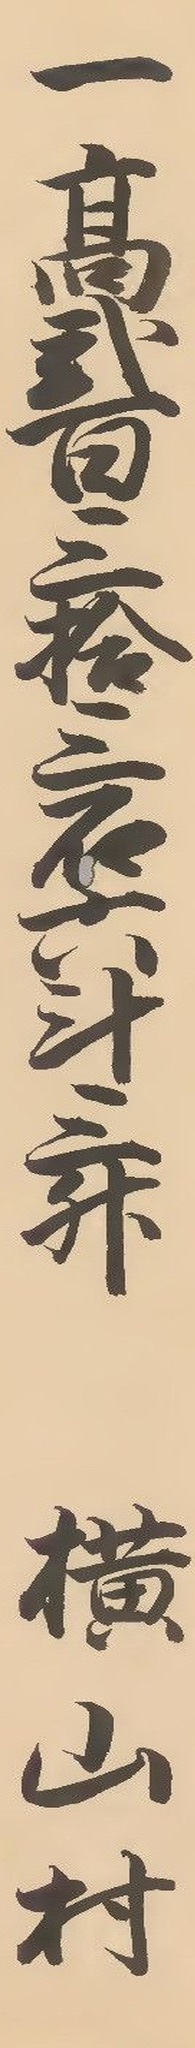一髙弐百三拾三石六斗三升横山村
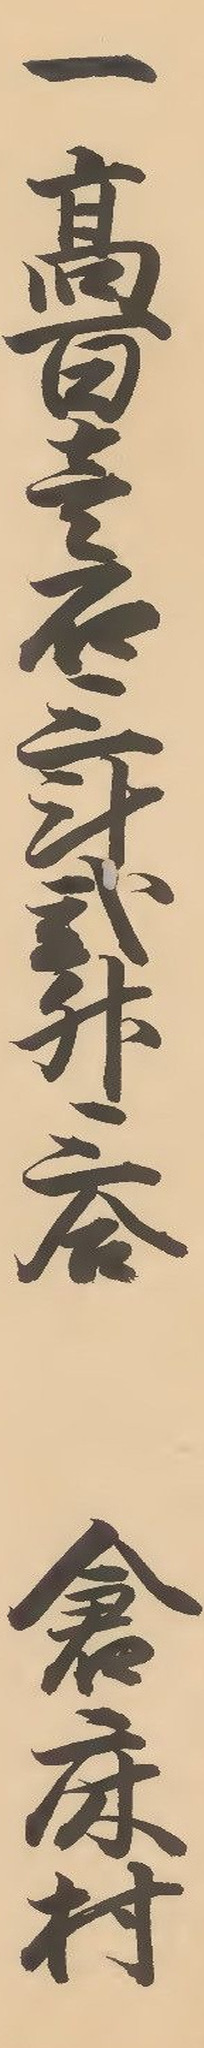一髙百壱石三斗弐升三合倉床村
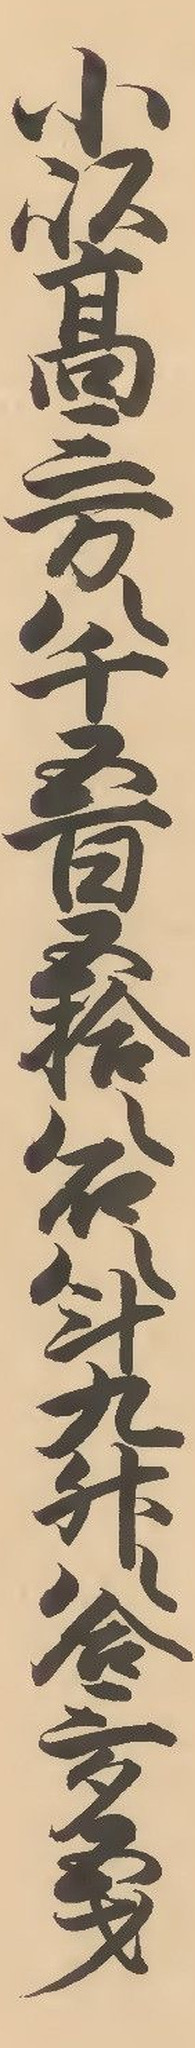小以髙三万八千五百五拾八石八斗九升八合八合三夕五才
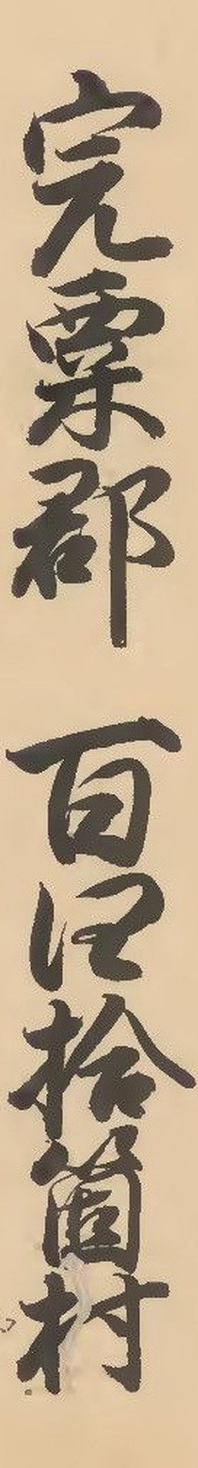完粟郡百四拾箇村
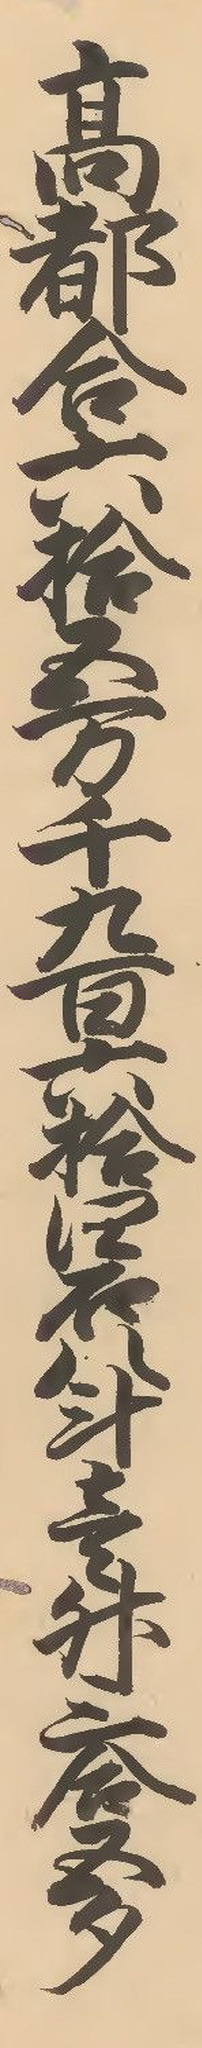髙都合六拾五万千九百六拾四石八斗壱升三合五夕

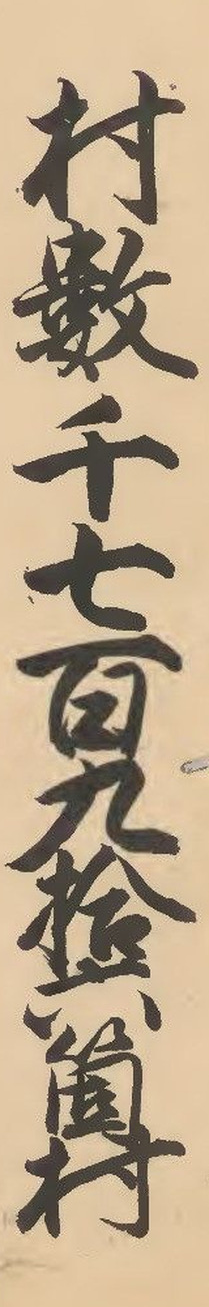村數千七百九拾六箇村
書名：播磨国郷帳
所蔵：国立公文書館 National Archives of Japan
